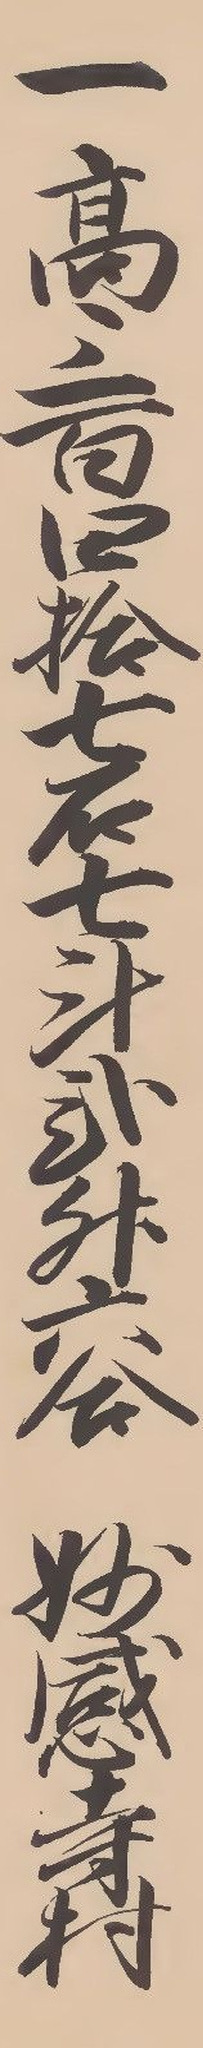一高三百四拾七石七斗弐升六合妙感寺村
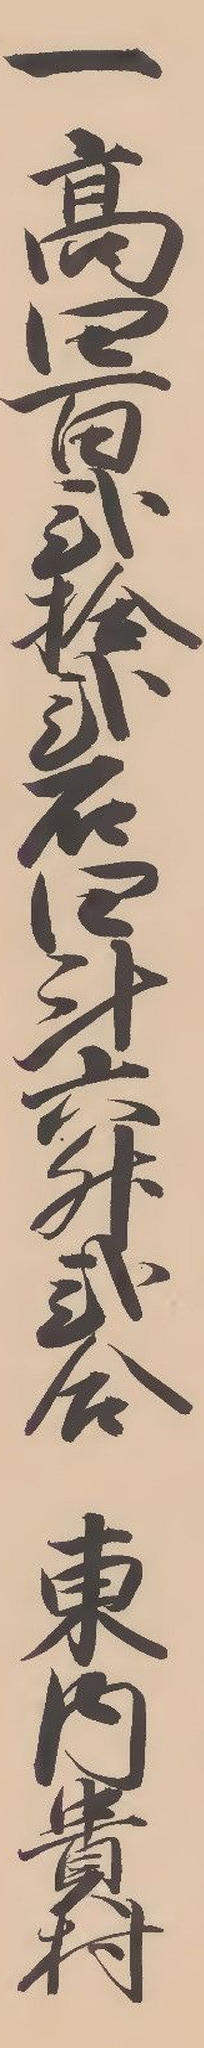一高四百弐拾弐石四斗六升弐合東内貴村

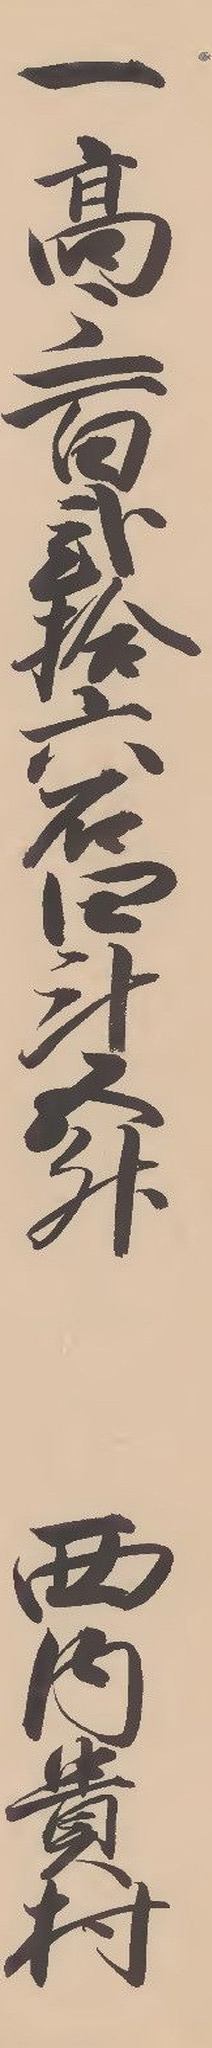一高三百弐拾六石四斗五升西内貴村
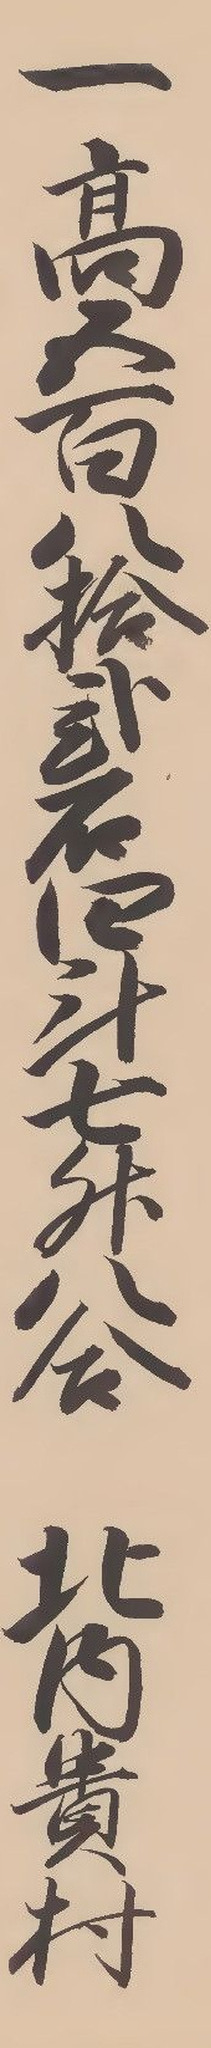一高五百八拾弐石四斗七升八合北内貴村
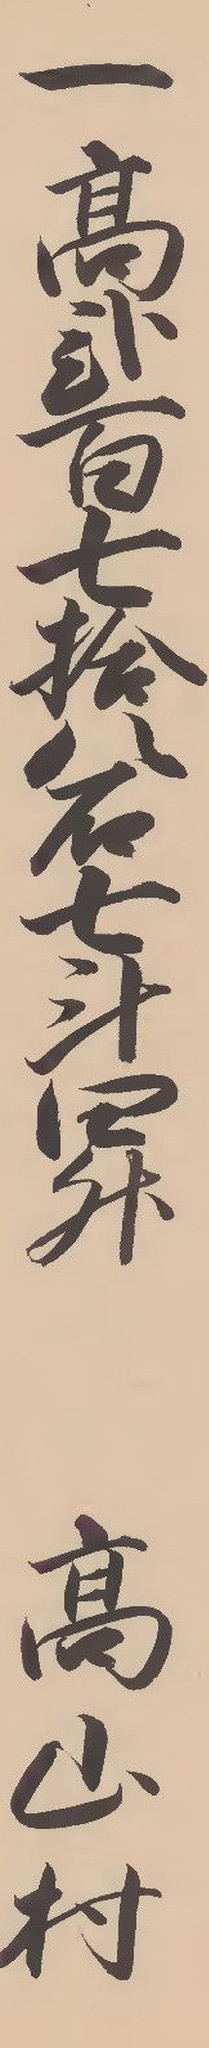一高弐百七拾八石七斗四升高山村
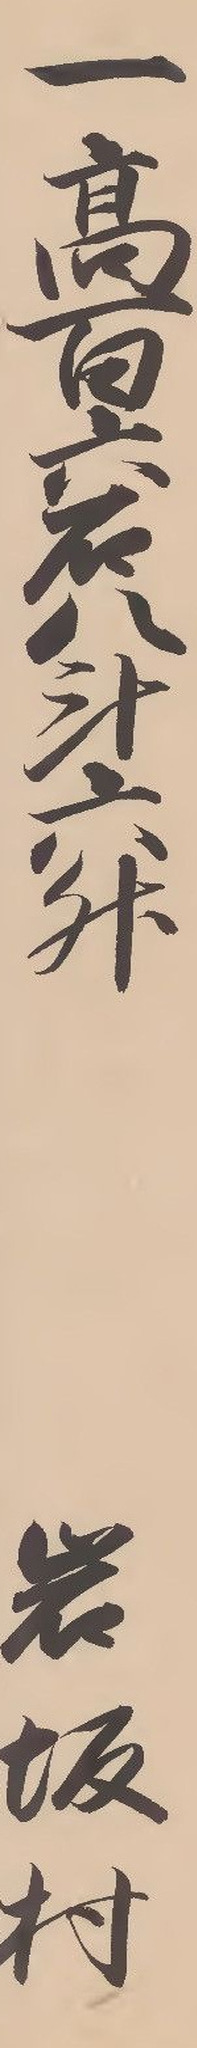一高百六石八斗六升岩坂村
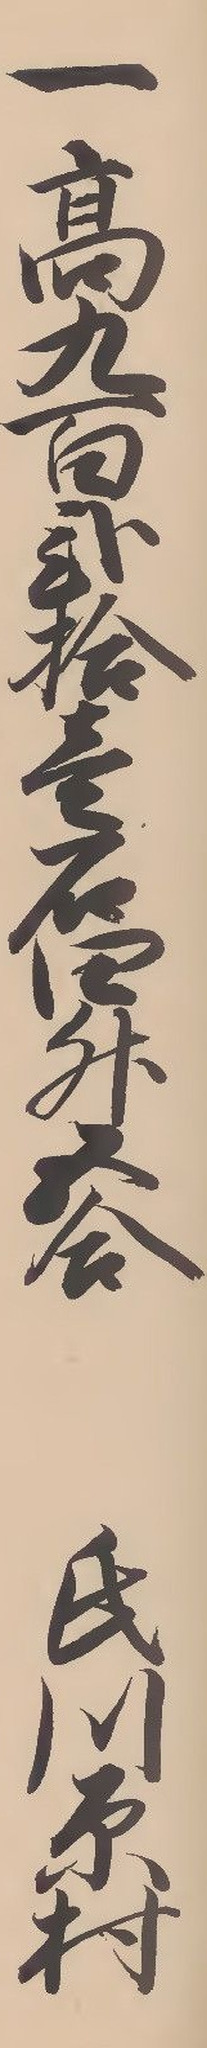一高九百弐拾壱石四升五合氏川原村
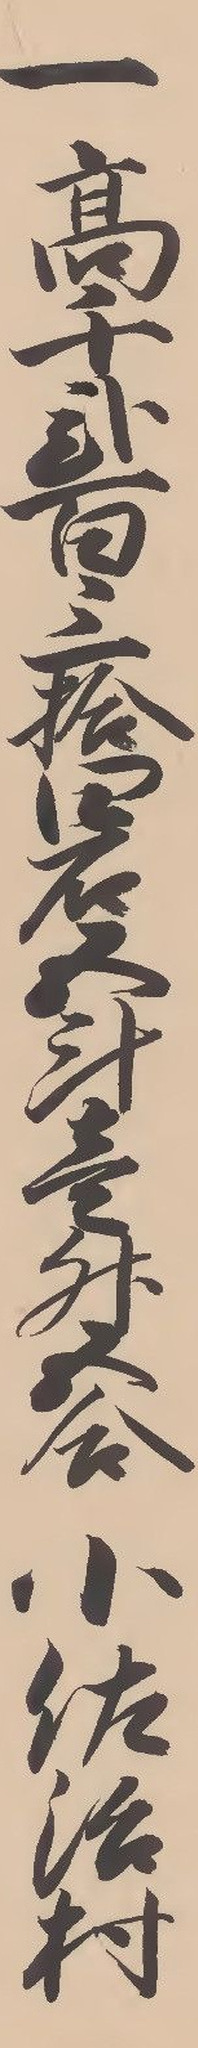一高千弐百三拾四石五斗壱升五合小佐治村
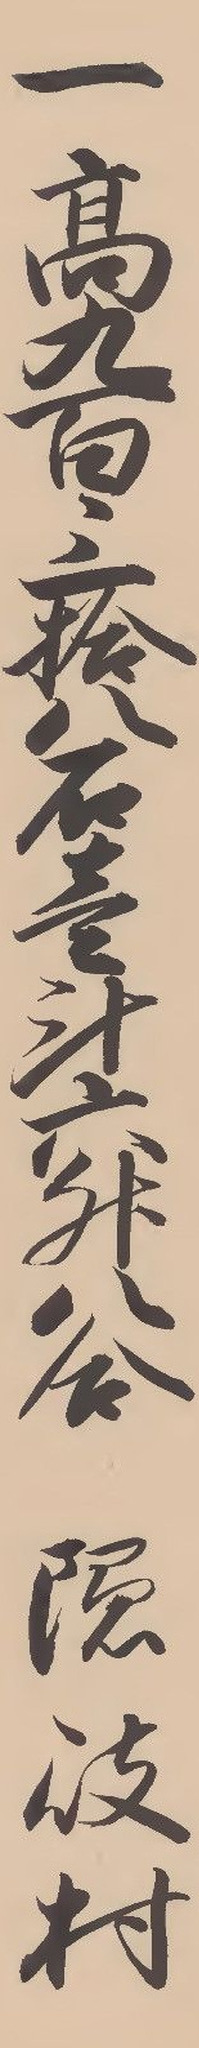一高九百三拾八石壱斗六升八合隠岐村
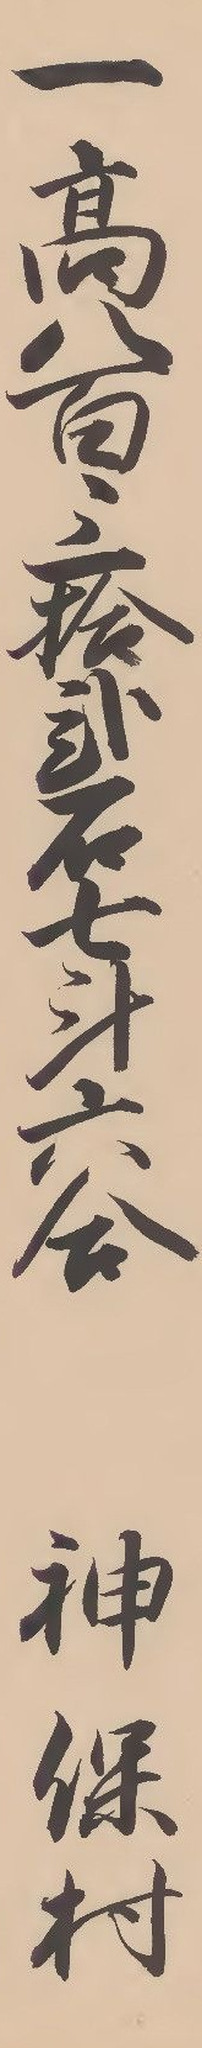一高八百三拾弐石七斗六合神保村

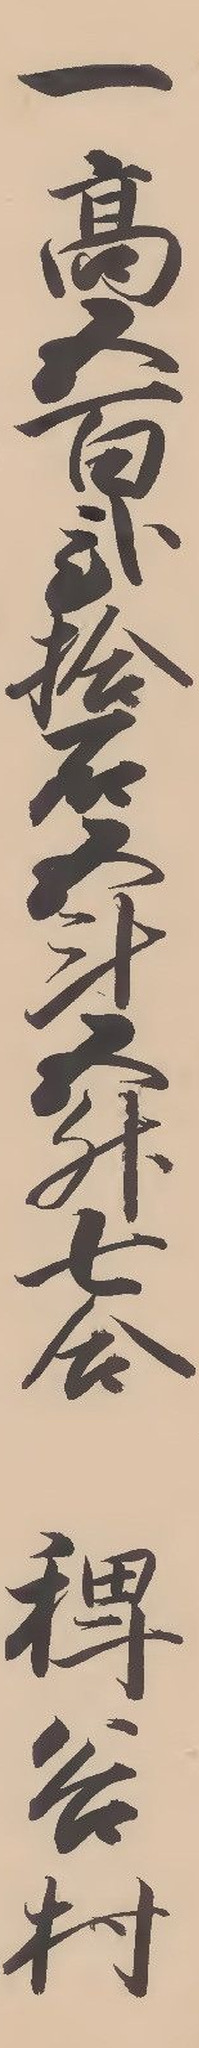一高五百弐拾石五斗五升七合稗谷村
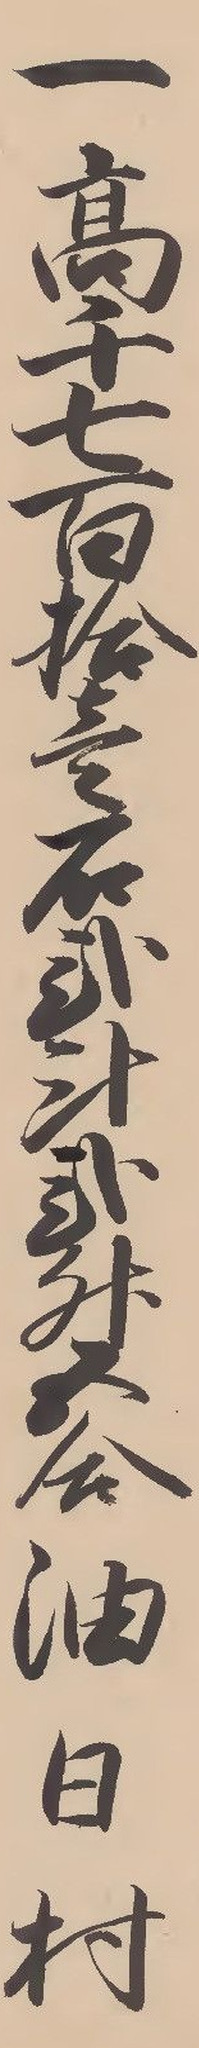一高千七百拾壱石弐斗弐升五合油日村
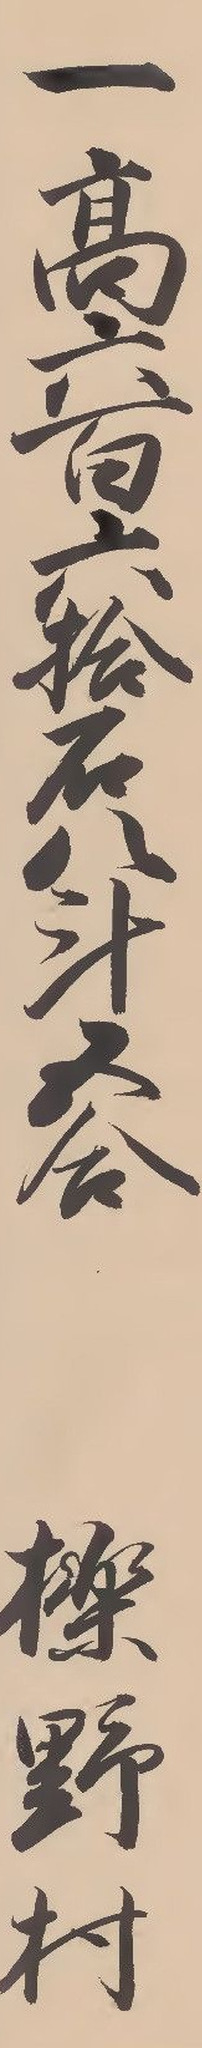一高六百六拾石八斗五合櫟野村
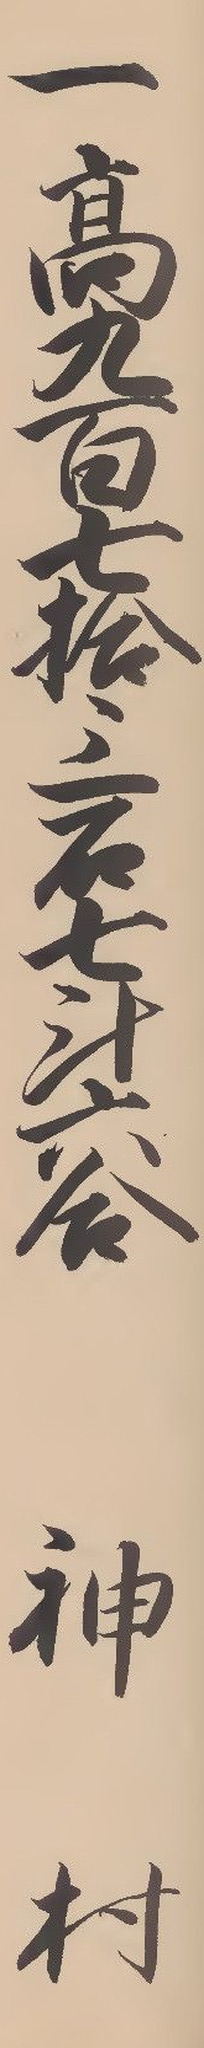一高九百七拾三石七斗六合神村
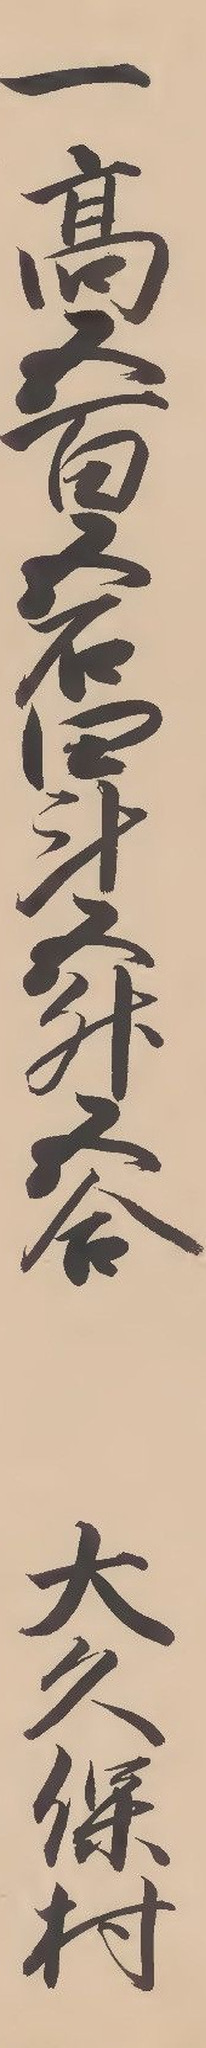一高五百五石四斗五升五合大久保村
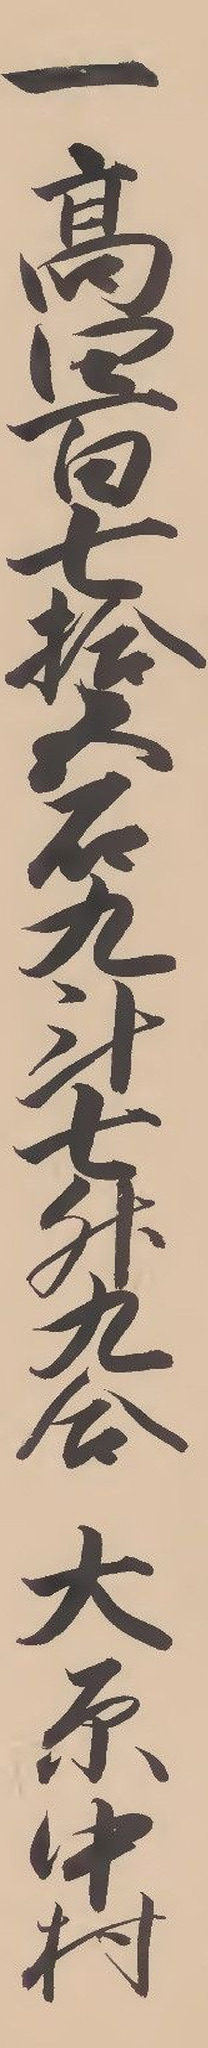一高四百七拾五石九斗七升九合大原中村
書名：近江国郷帳
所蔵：国立公文書館 National Archives of Japan
